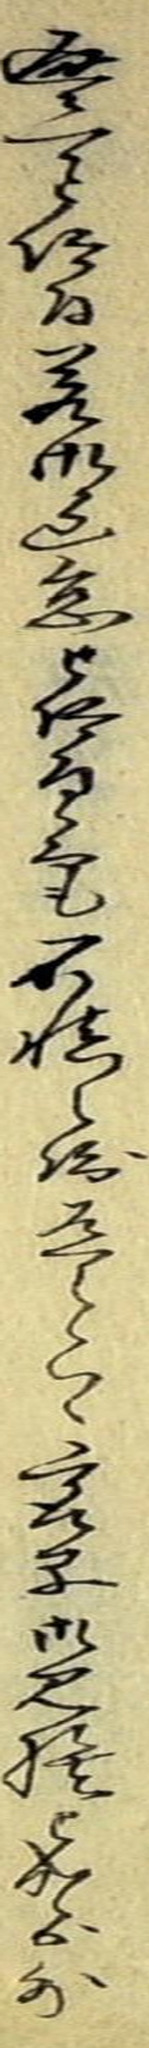通に可被仰付若御過怠被仰付候而も不慎之儀有之候はヽ最早御見捨被成ゟ外
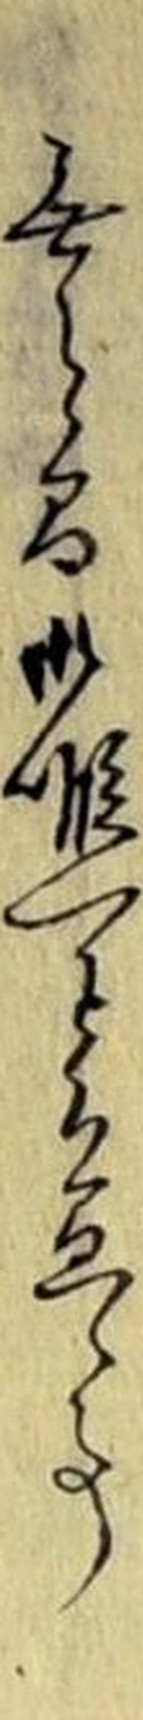無之候間御暇可被下置候事
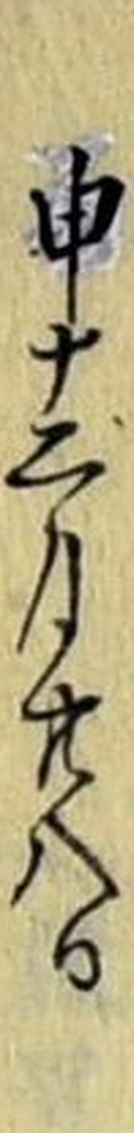申十二月廿八日

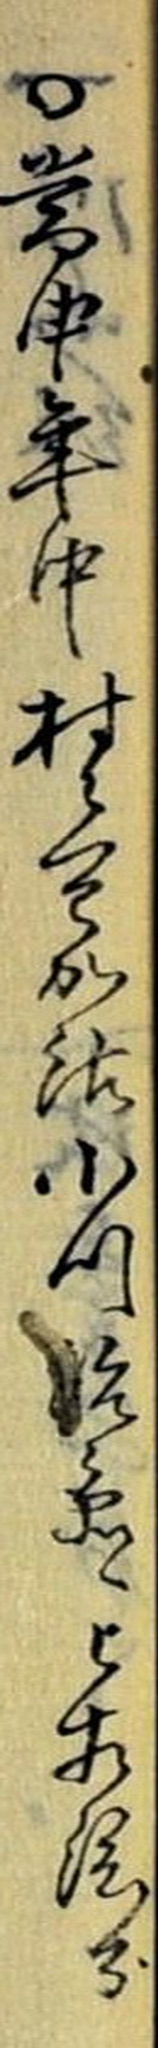○当申年中村々冥加銀小川治兵衛へ被相渡分
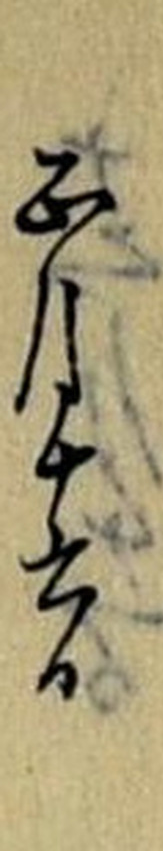正月十六日
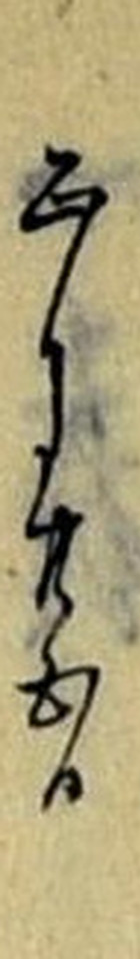正月廿五日
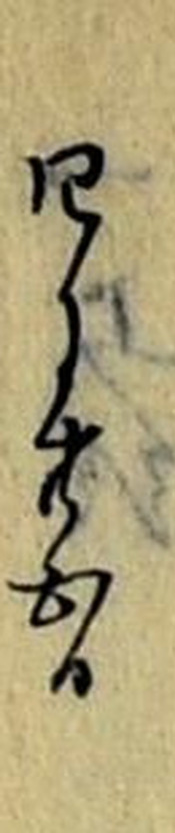四月廿五日

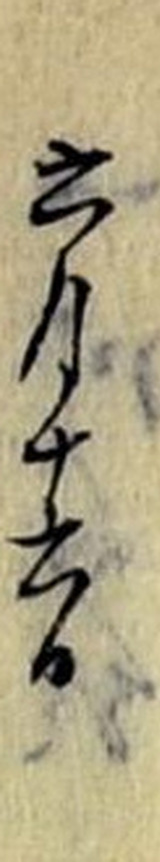六月十六日
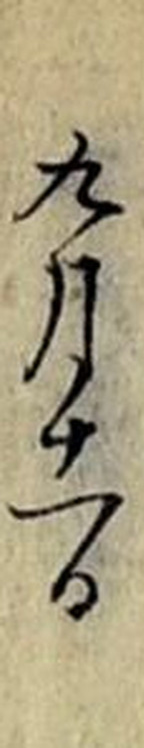九月十一日
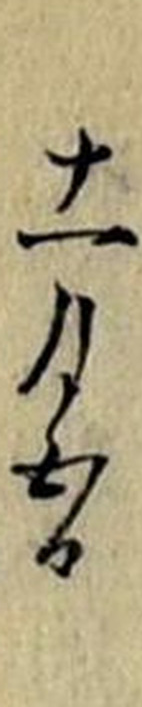十一月五日
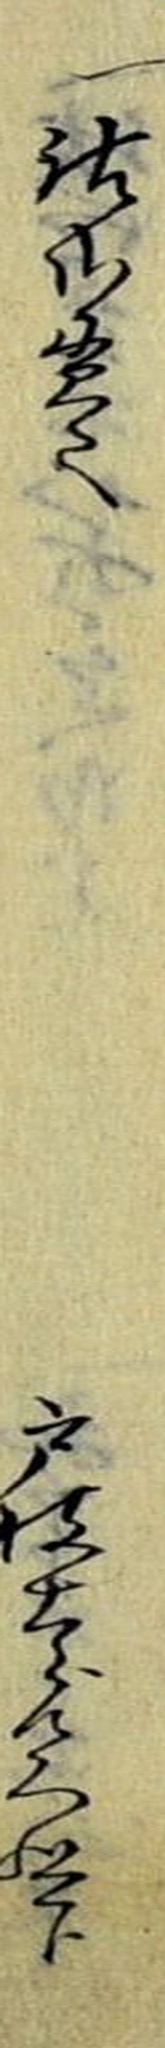銀弐貫匁佐藤佐五右衛門組下
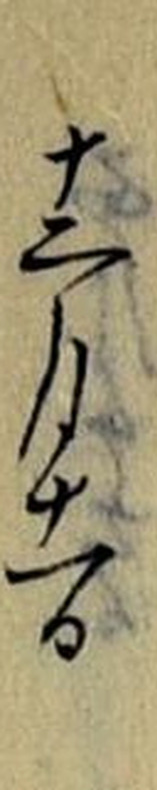十二月十一日
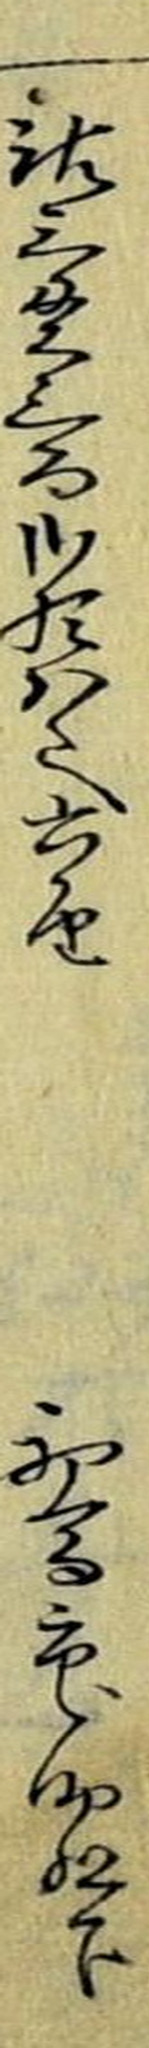銀三貫三百弐拾八匁六厘初馬市郎助組下
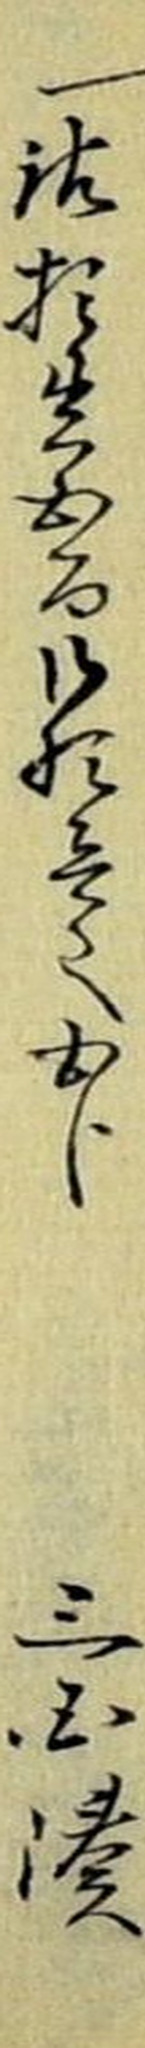銀拾貫五百弐拾壱匁五分三国湊
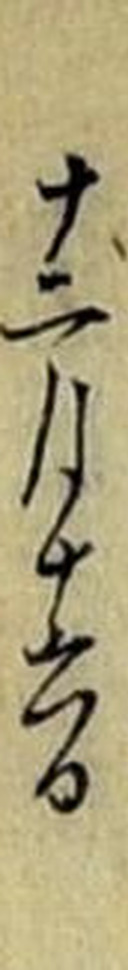十二月十六日

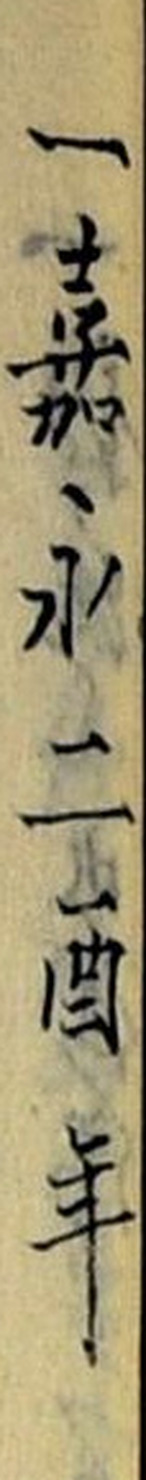一嘉永二酉年
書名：命令之部 六
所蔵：福井県文書館 Fukui Prefectural Archives
